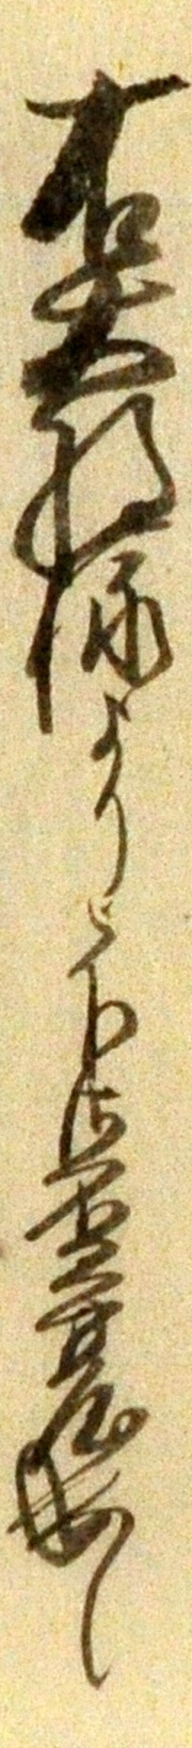右大将様より被下御盃台出之
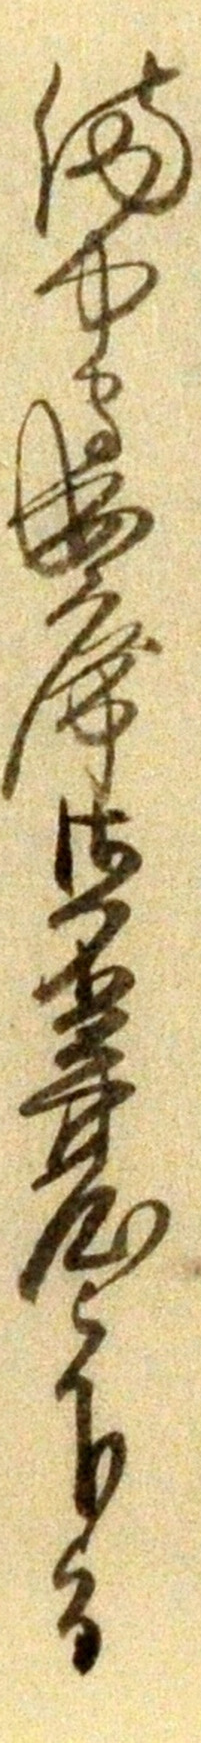備中守出席御盃台被下旨
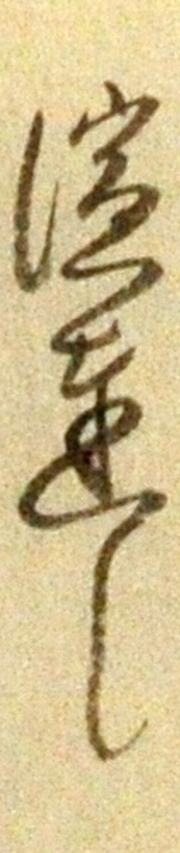演達之
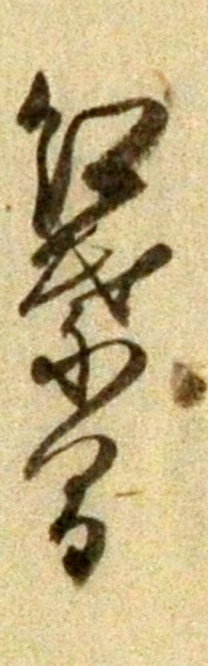紅葉間
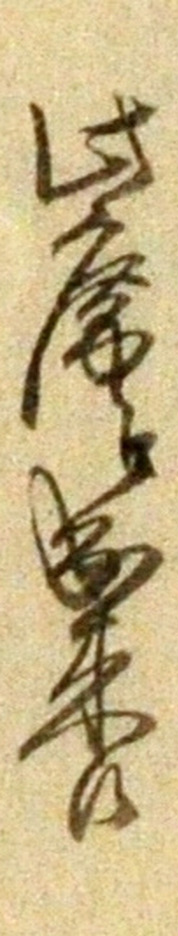此席え出来候
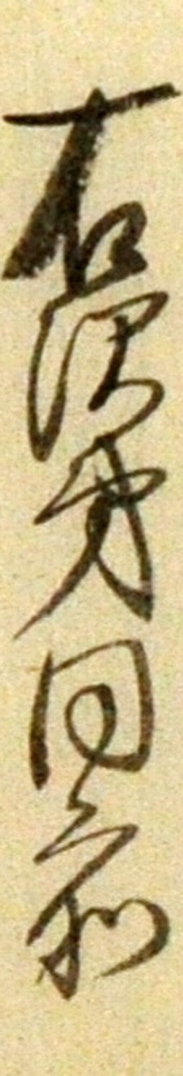右次第同前
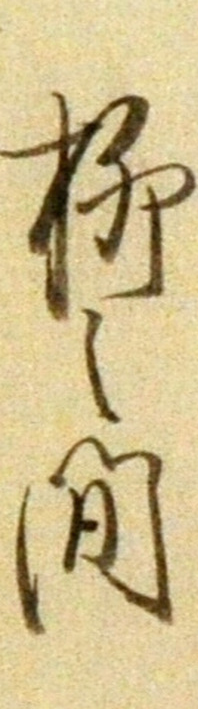柳之間

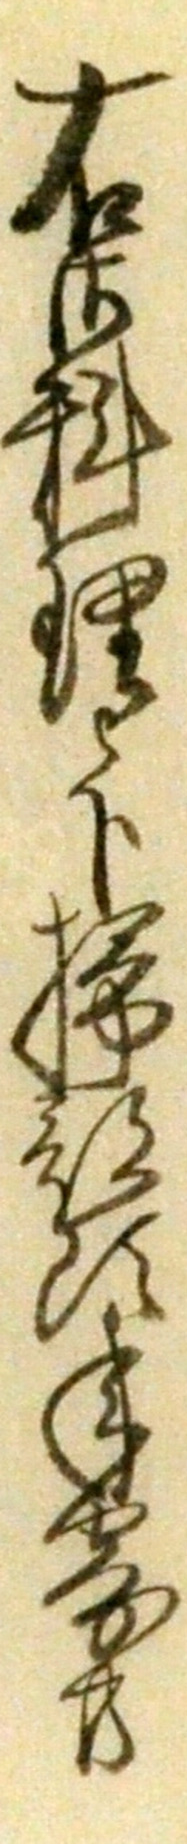右御料理被下掃部頭年寄共
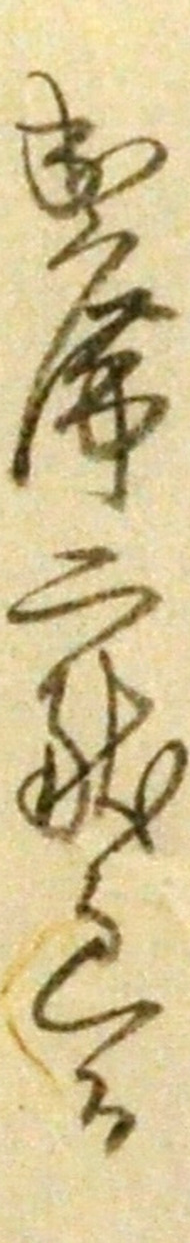出席二献過而
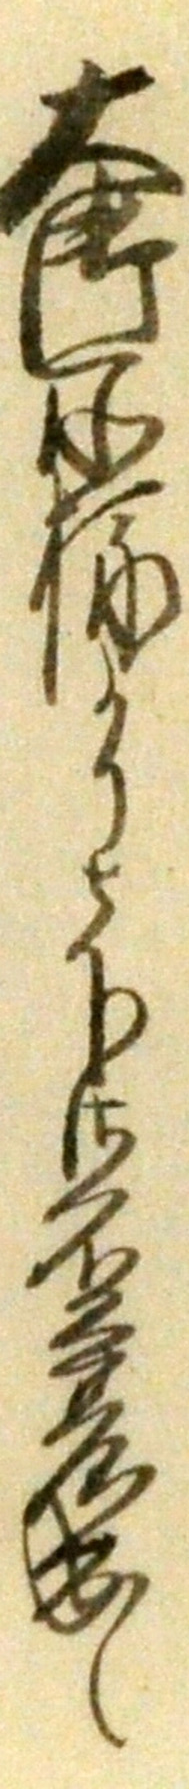大御所様より被下御盃台出之
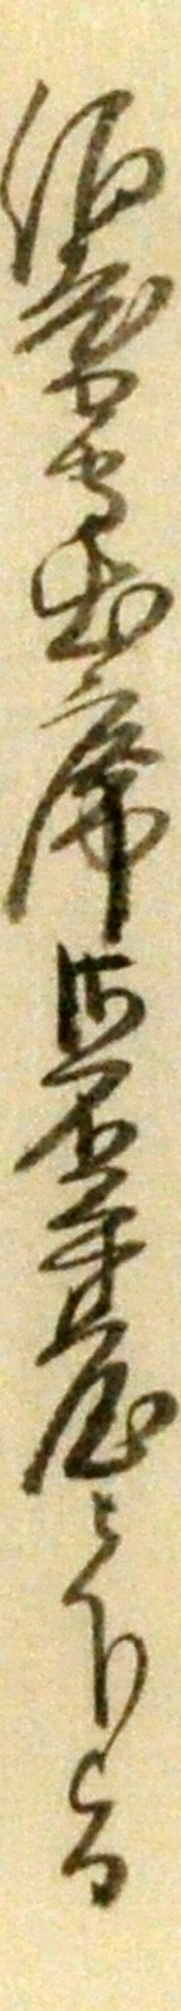伯耆守出席御盃台被下旨
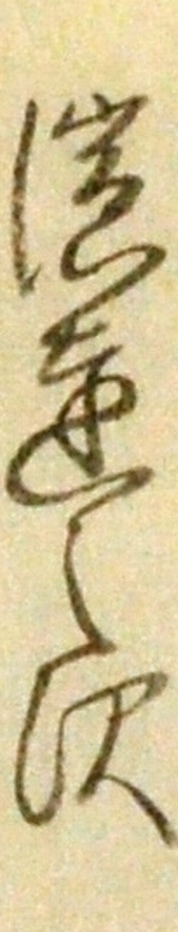演達之次
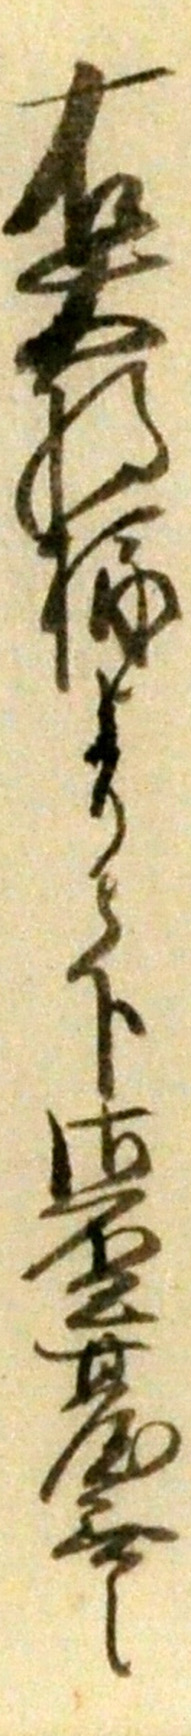右大将様より被下御盃台無之
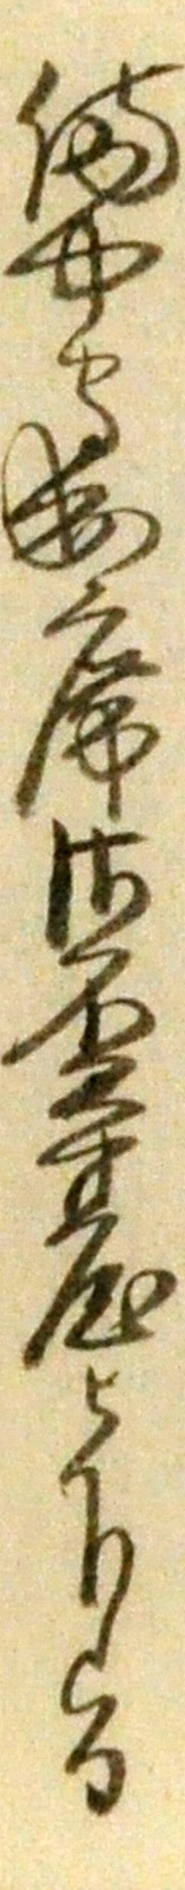備中守出席御盃台被下旨
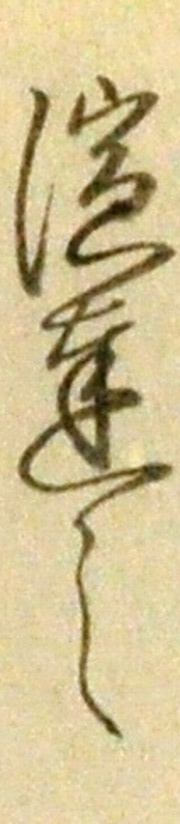演達之
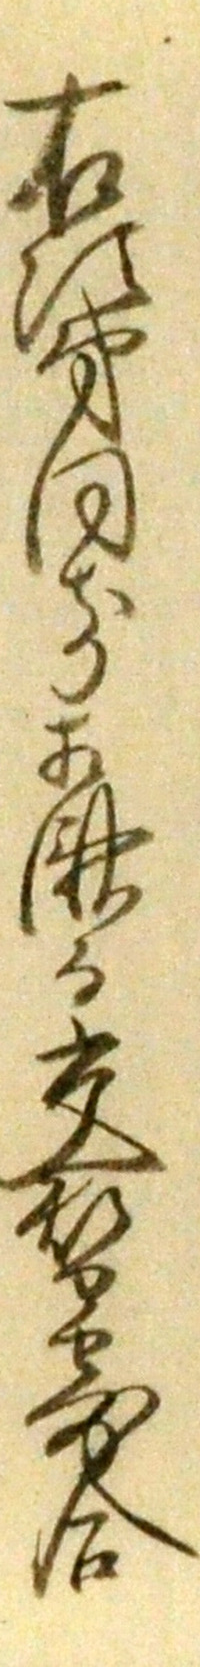右次第同前相済而交替寄合
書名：御馳走御能ノ節ノ留外
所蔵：伊那市立高遠町図書館・合同会社AMANE
